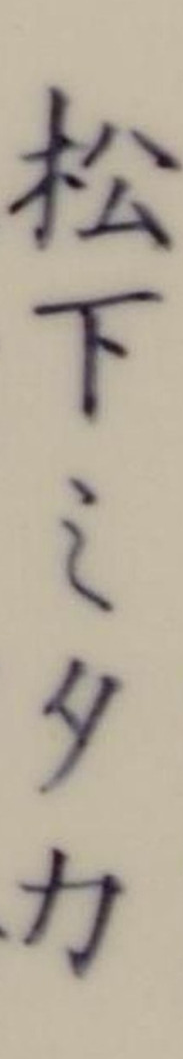松下ミ夕力
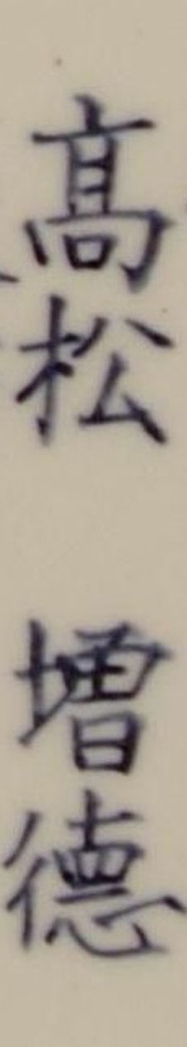高松増徳
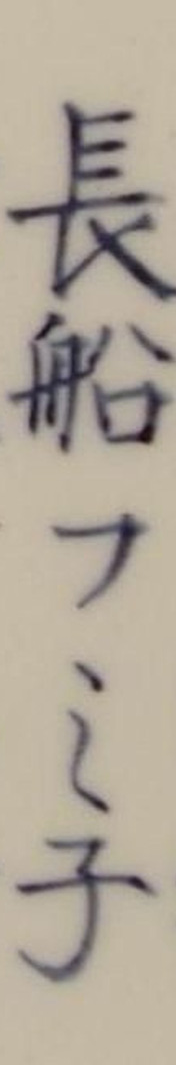長船フミ子
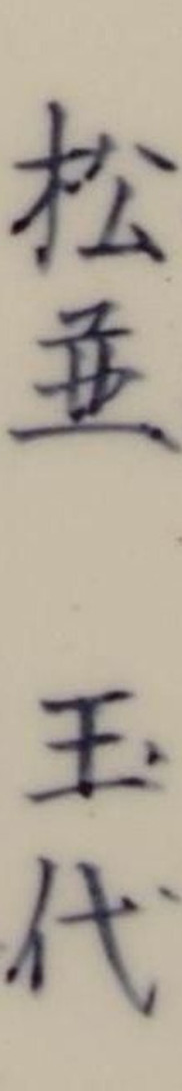松並玉代
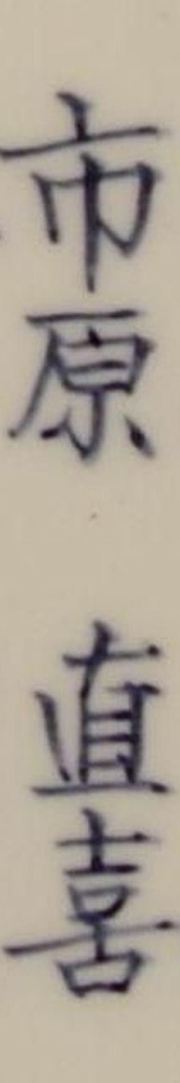市原直喜
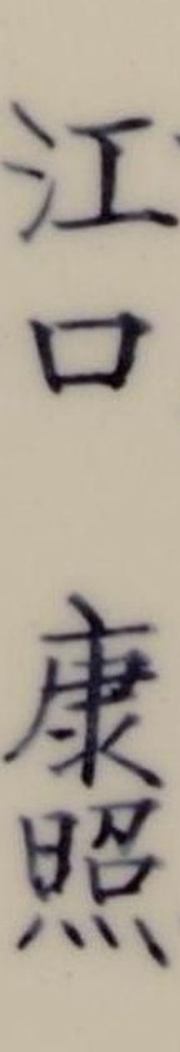江口康照
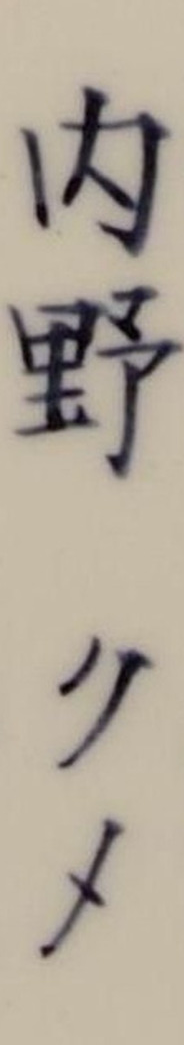内野クメ
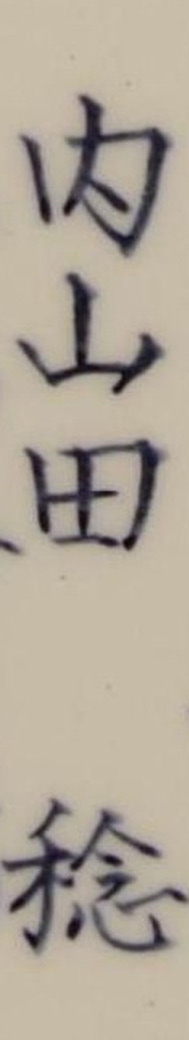内山田稔
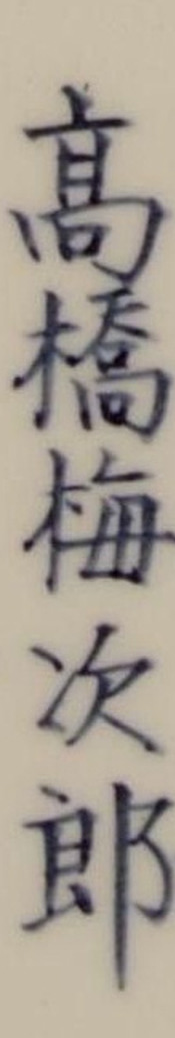高橋梅次郎
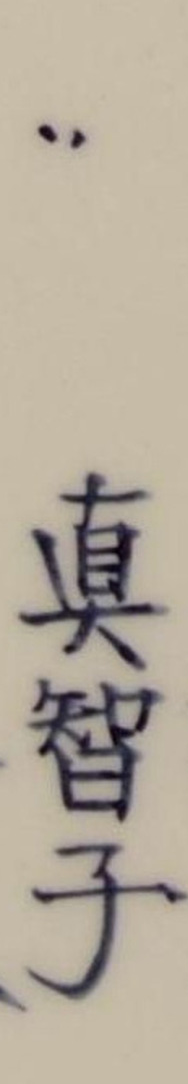真智子
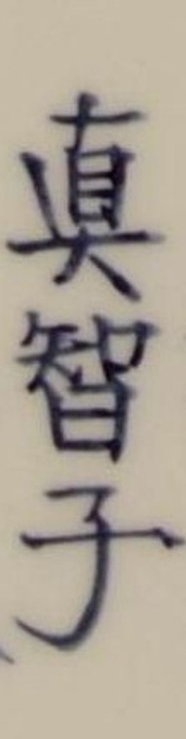真智子
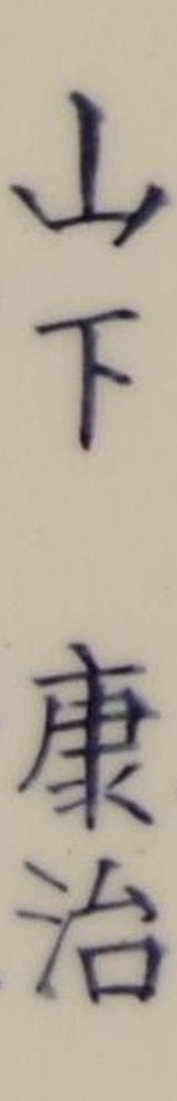山下康治
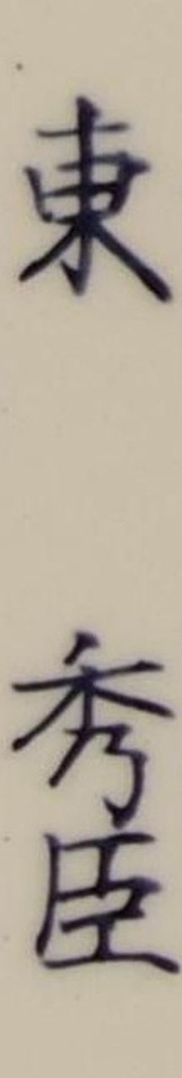東秀臣
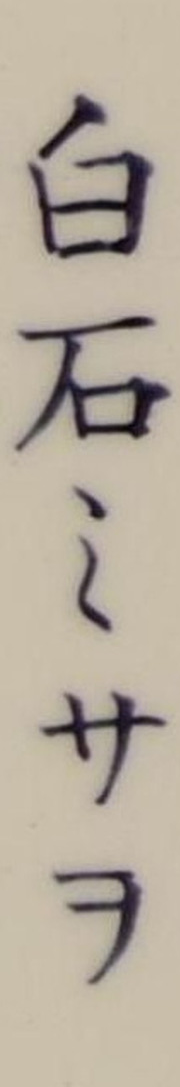白石ミサヲ
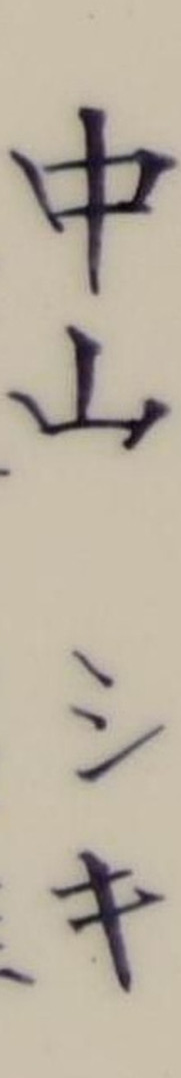中山シキ
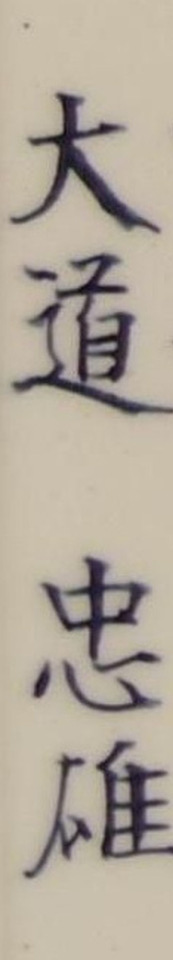大道忠雄
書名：M~S
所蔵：高野山金剛峯寺
